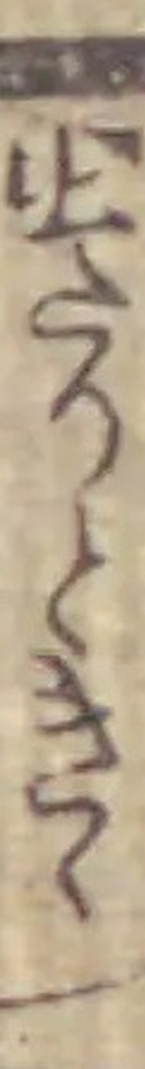出たりときゝ
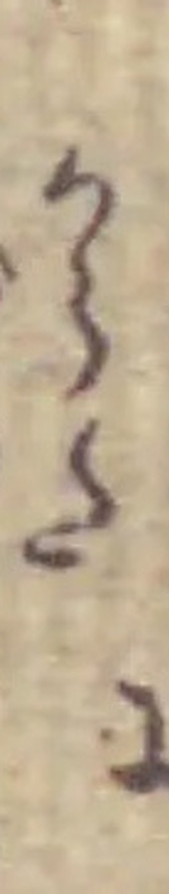からた
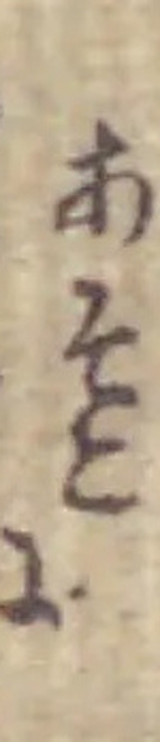あそこに
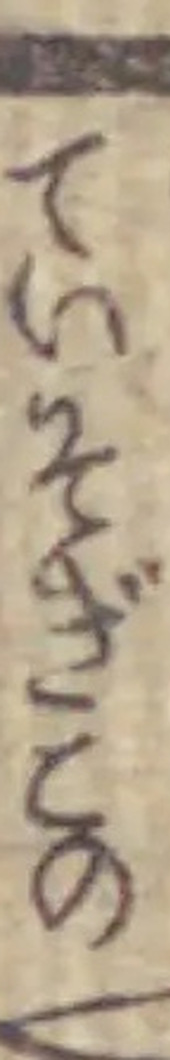ていそぎこの
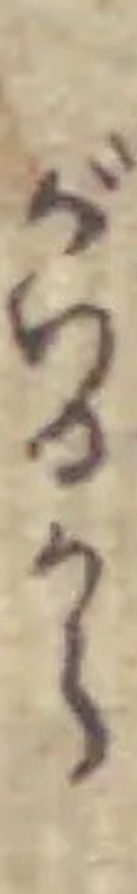がいるから
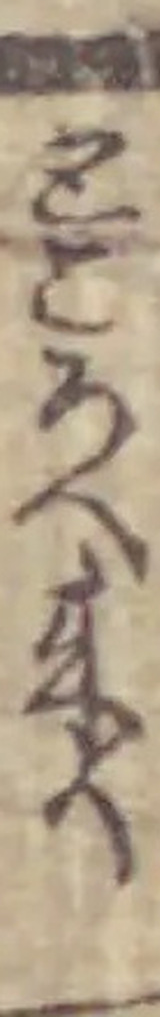ところへ来り
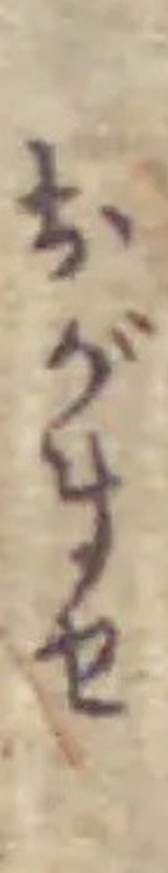おがませ
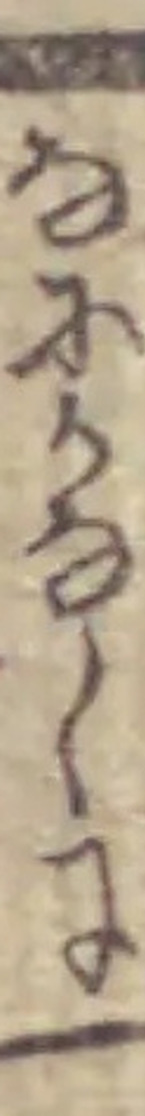なにかなしに
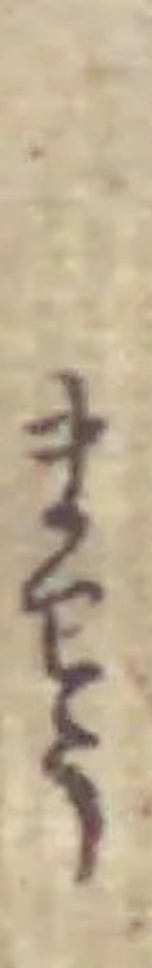ませう
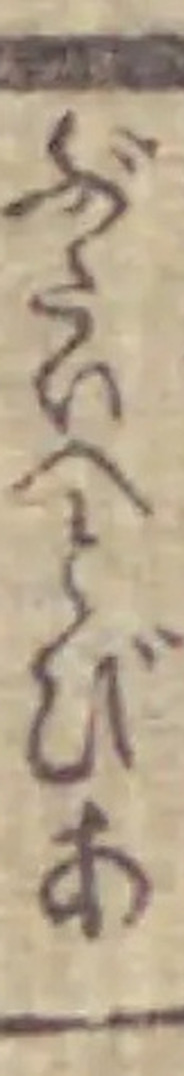ぶたいへとびあ
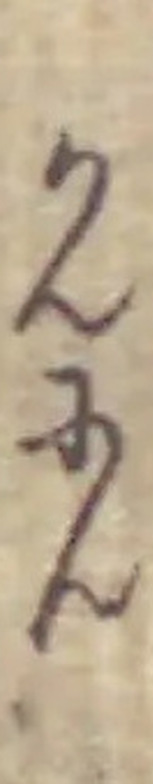かんにん
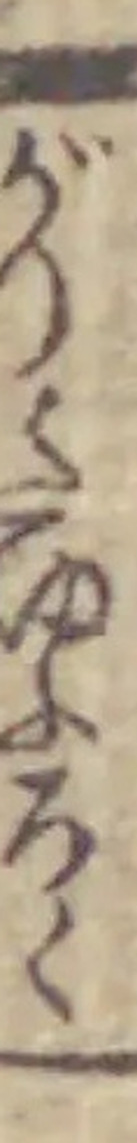がりたゆふろく
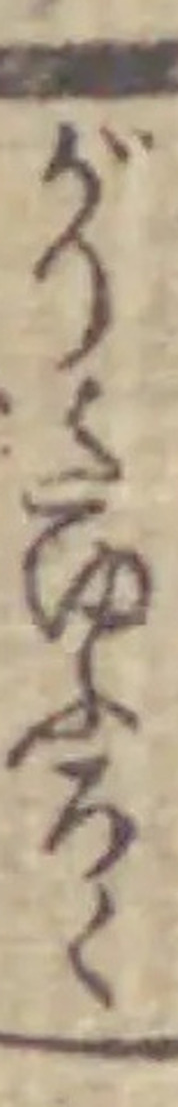がりたゆふろく
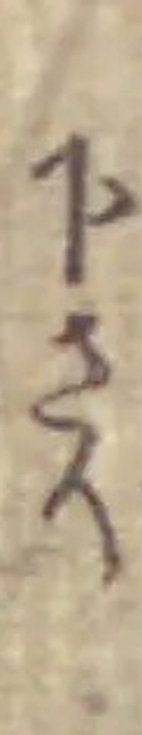下さり
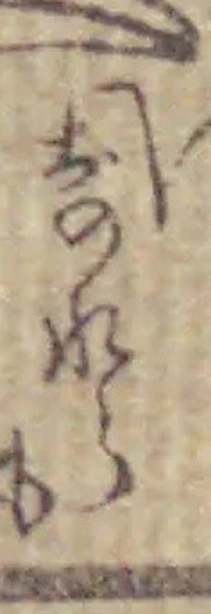〽おもれら
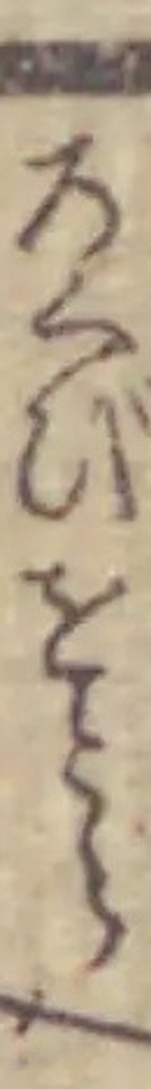ろくびをとら
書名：化物敵討 2巻
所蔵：国立国会図書館 National Diet Library, JAPAN
